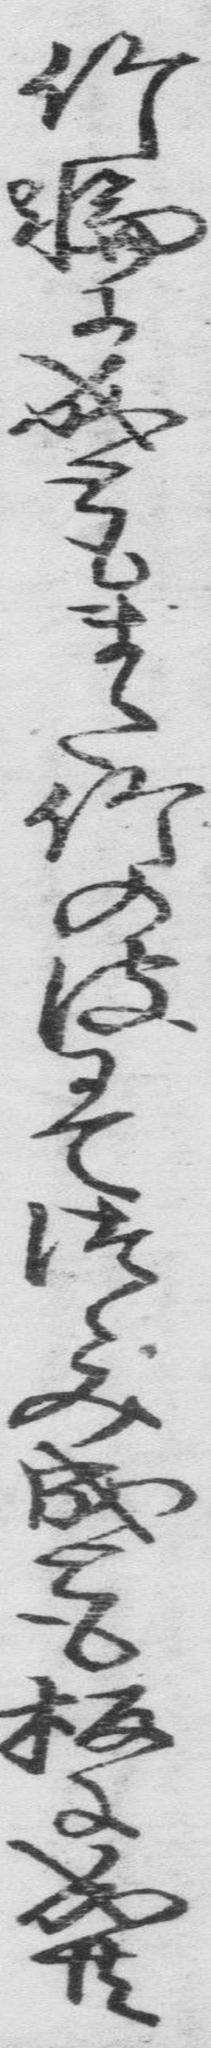竹輪尓成ともまた竹の皮尓て徒々み成とも板尓成共
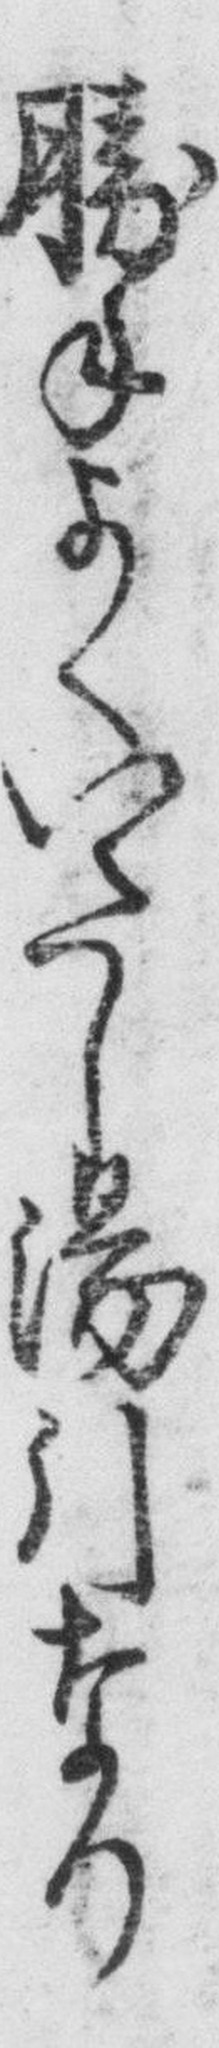勝手よくいたし湯引なり
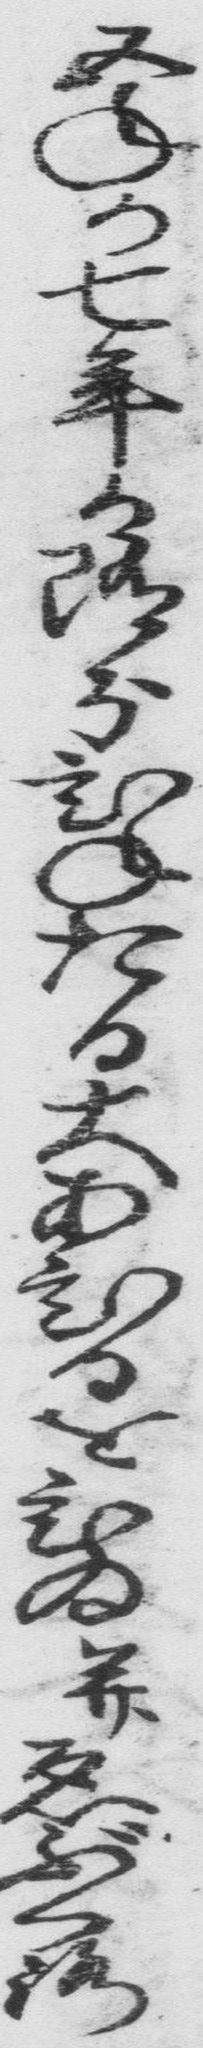五年か七年か随分飛年たる大あ飛るを飛ゐ幷ゑぶく路
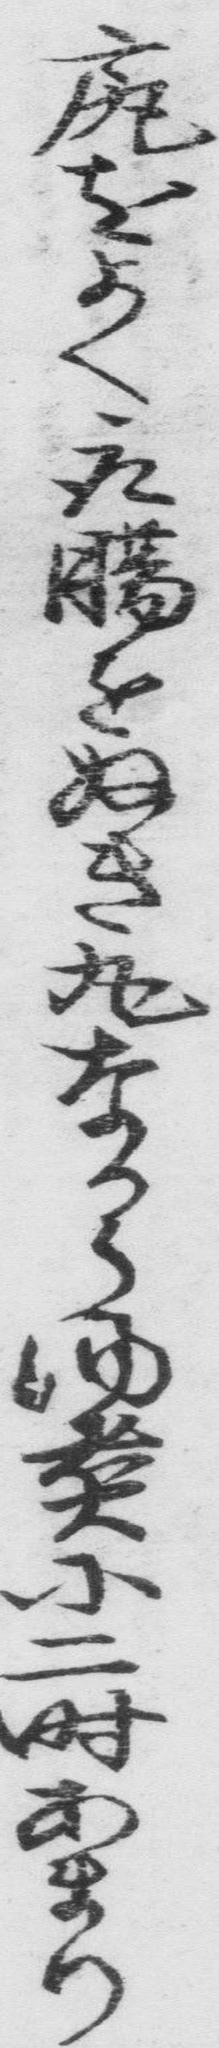尻をよく取腹をぬき丸なからゆ煮尓二時あまり
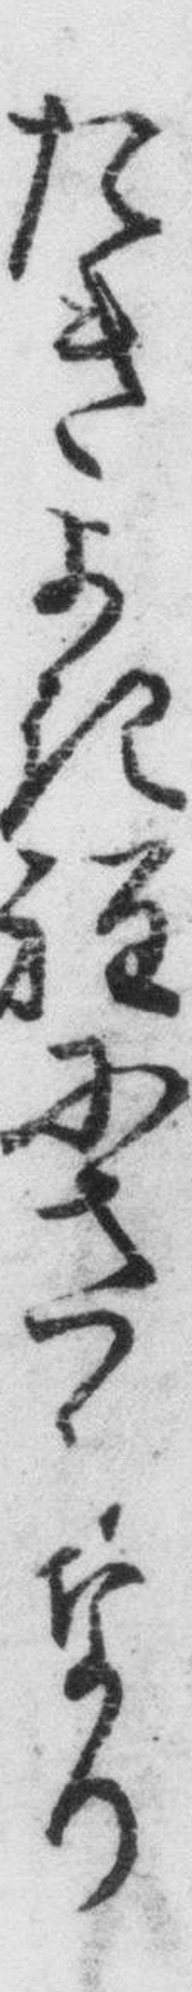たきよ起程尓さくなり
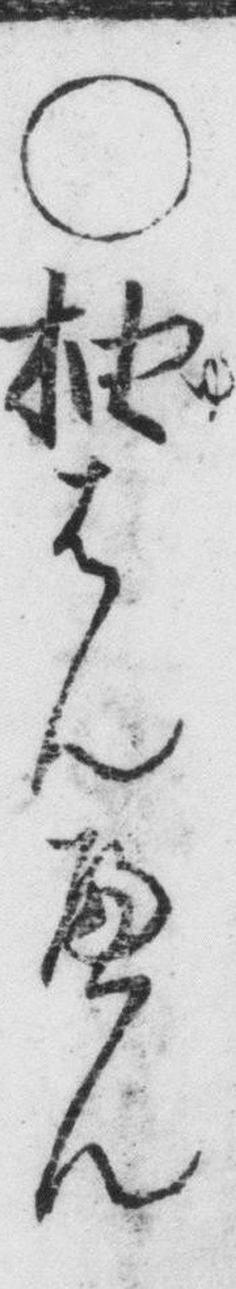〇柚はん扁ん
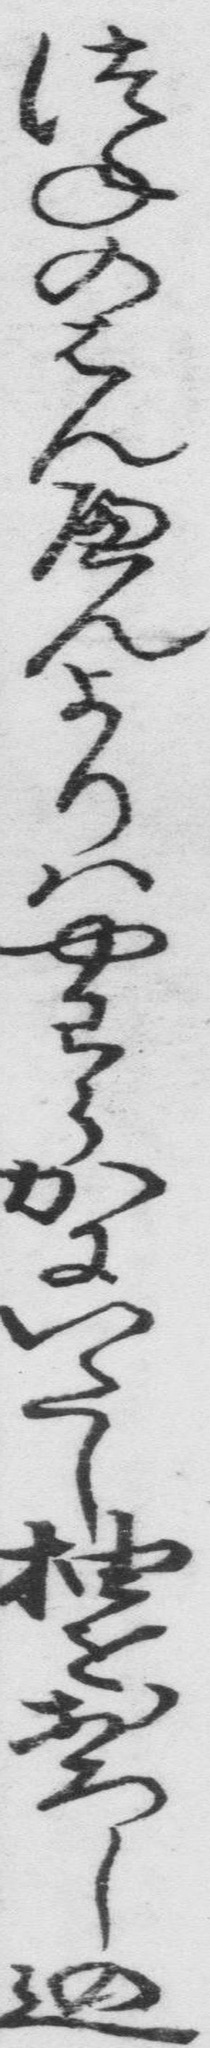徒年のはん扁んよりはやわらか尓いたし柚をおろし込
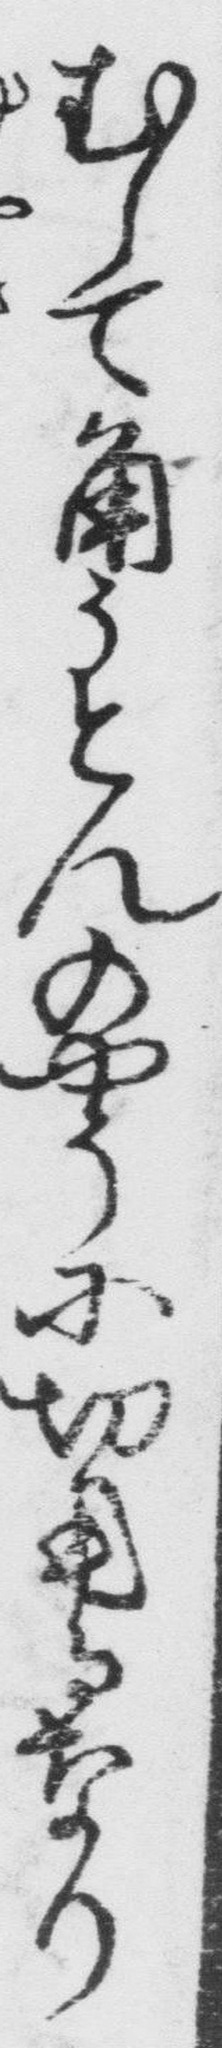むして角うとんのやう尓切用るなり
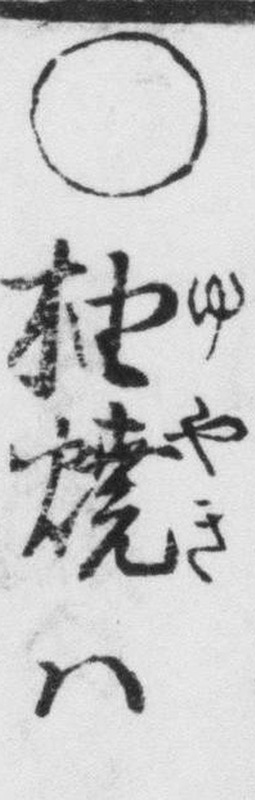〇柚焼は
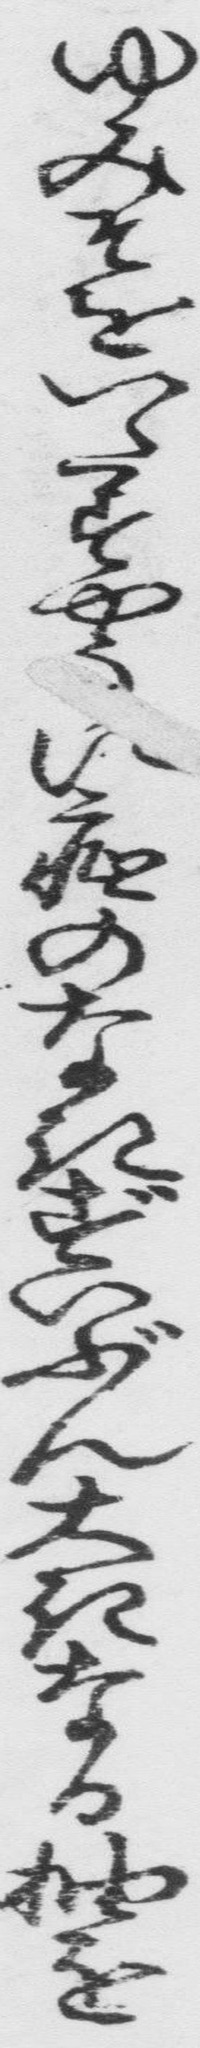ゆみそをいた春やう須疵のな起ずいぶん大起なる柚を
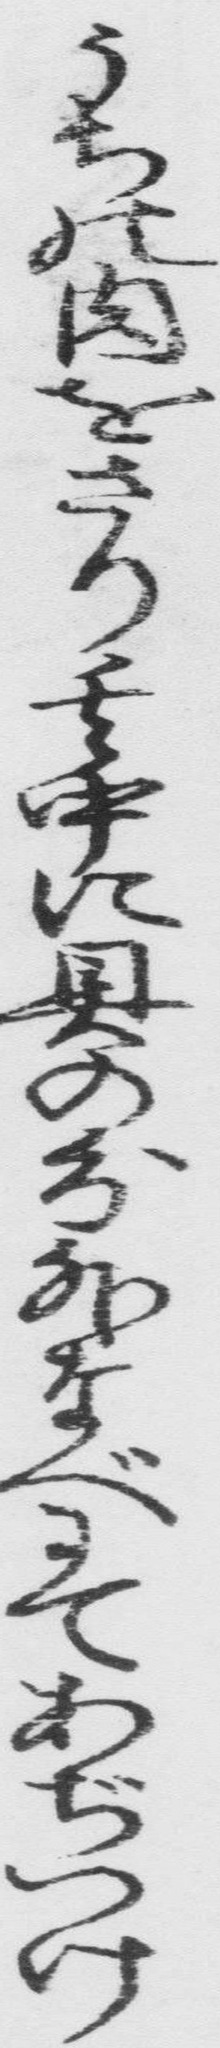うち能肉をさり其中に具の分外なべ尓てあぢつけ
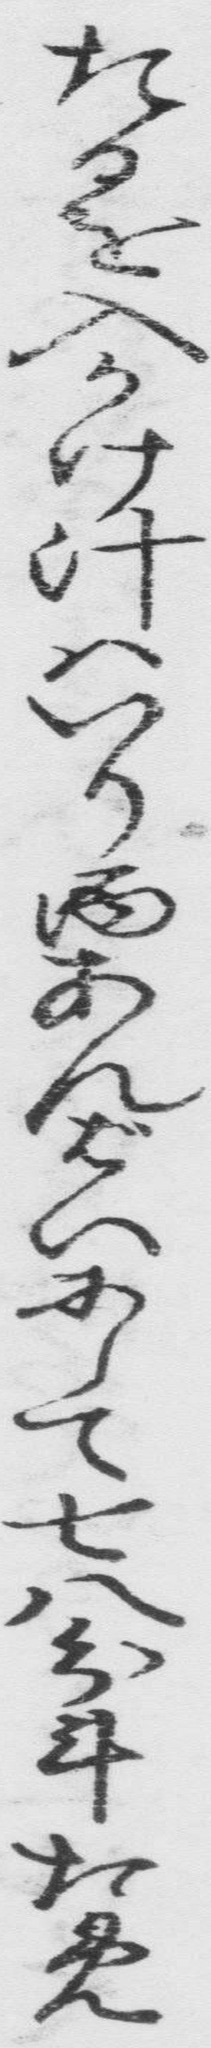たるを入かけ汁はいり酒あんばい尓して七八分斗た免
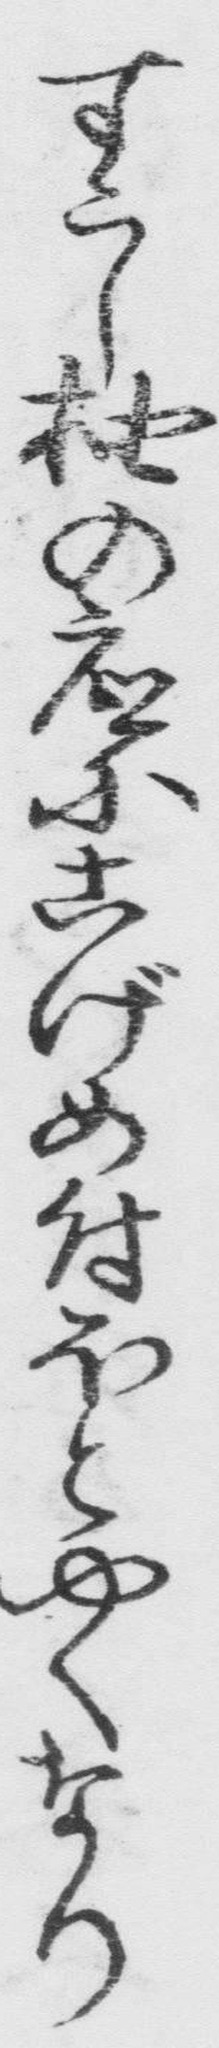すこし柚の底尓古げめ付不とやくなり
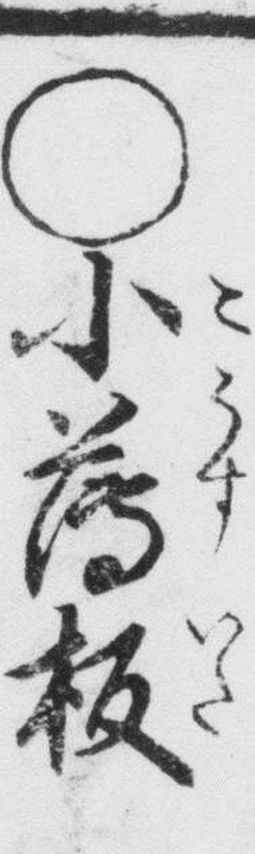〇小薄板
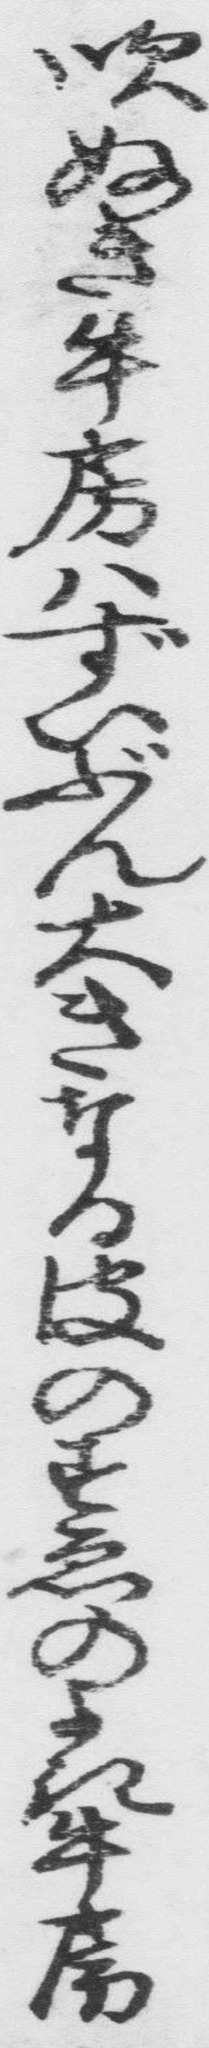吹ぬき牛房はずいぶん大きなる皮の春ゑのよ起牛房
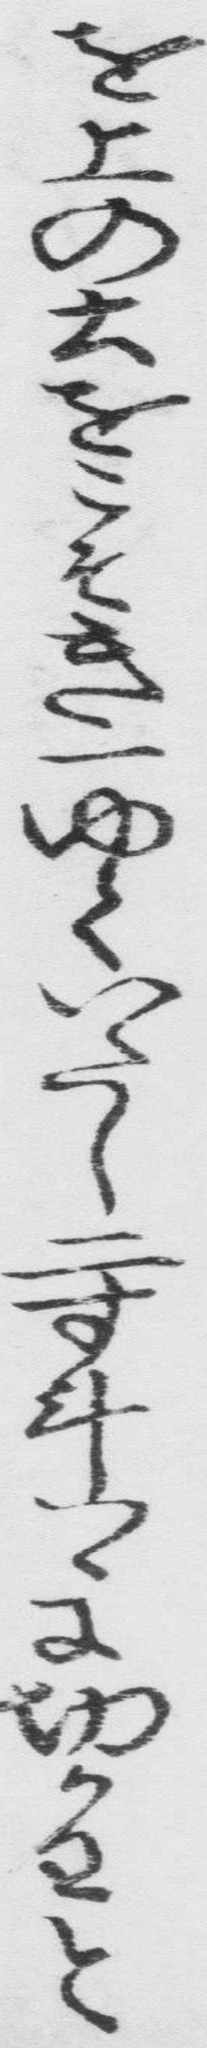を上の土をこそき一ゆていたし二寸斗つゝ尓切かわと
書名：普茶料理抄
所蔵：大阪府立大学学術情報センター 国文学研究資料館
